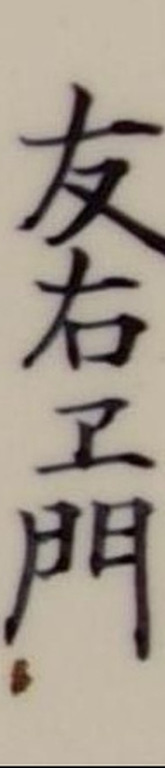友右ヱ門
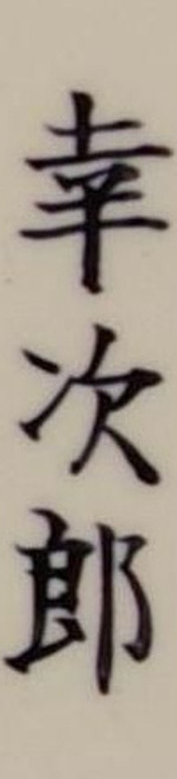幸次郎
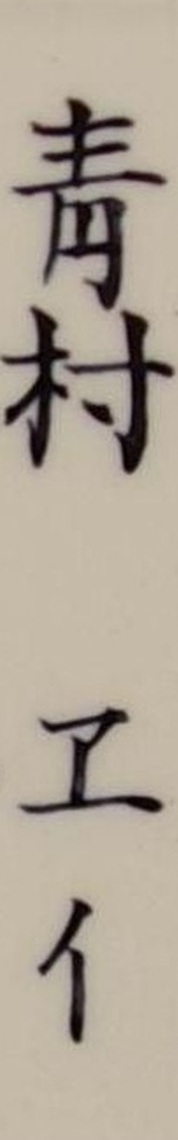青村エイ
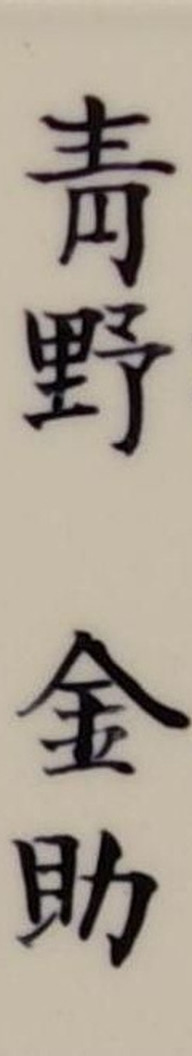青野金助
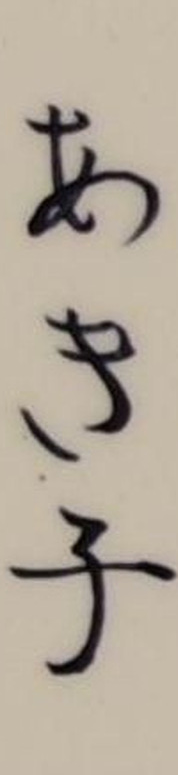あき子
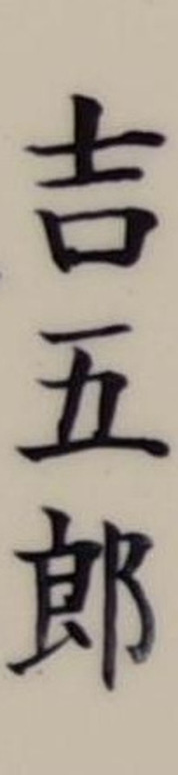吉五郎
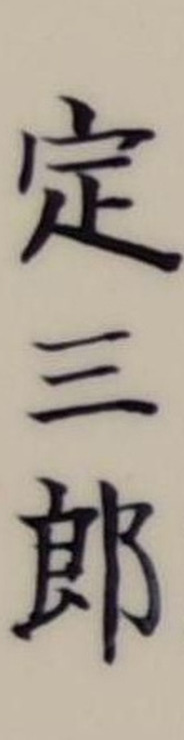定三郎
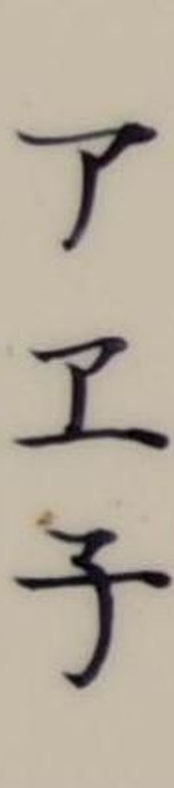アエ子
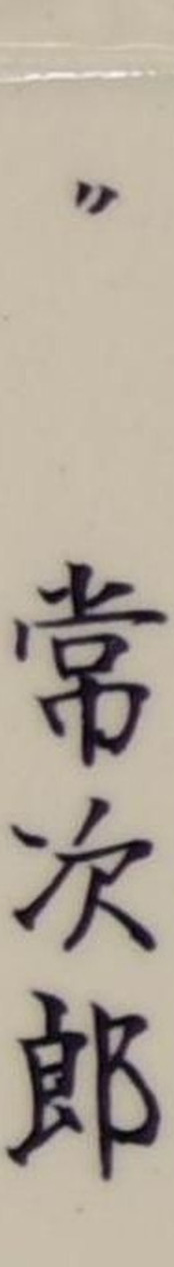常次郎
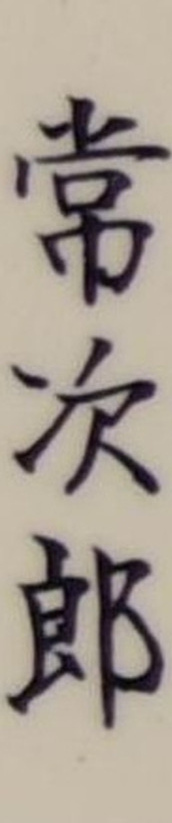常次郎

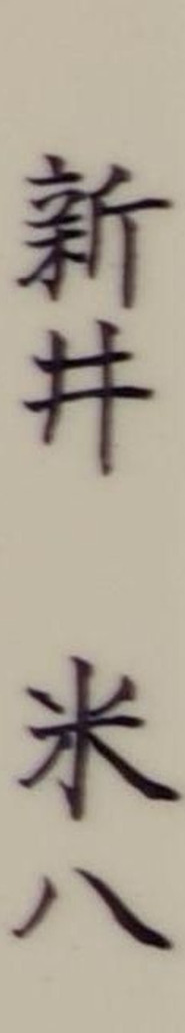新井米八
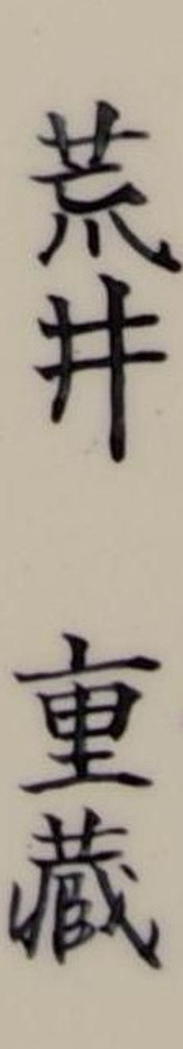荒井重蔵
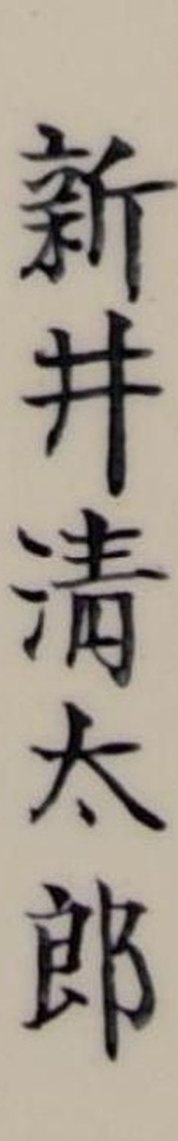新井清太郎
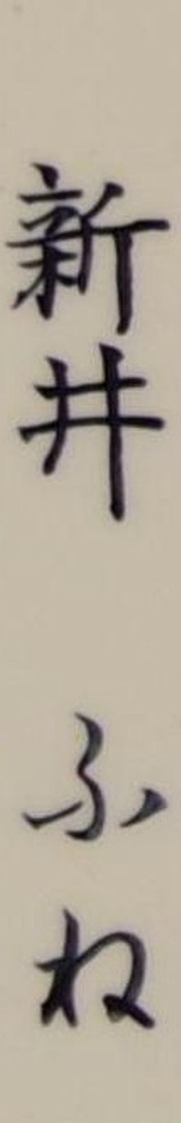新井ふね
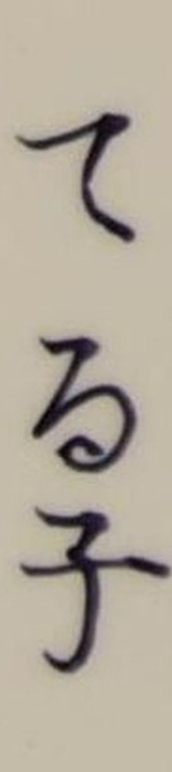てる子
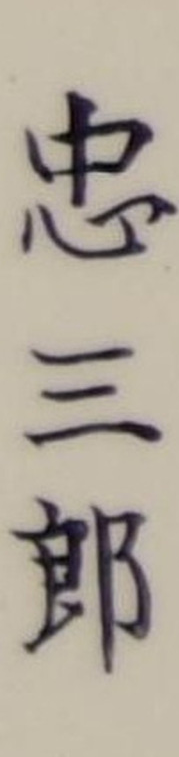忠三郎
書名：E~L
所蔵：高野山金剛峯寺
